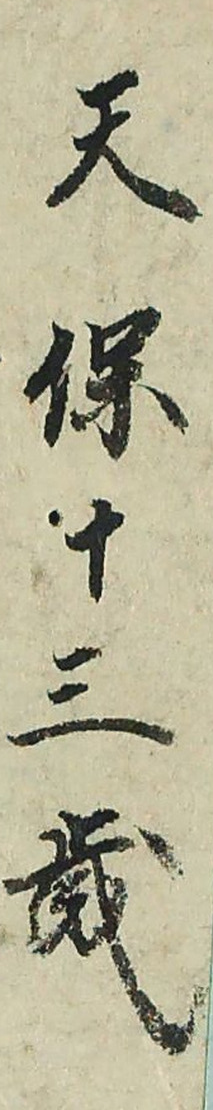天保十三歳
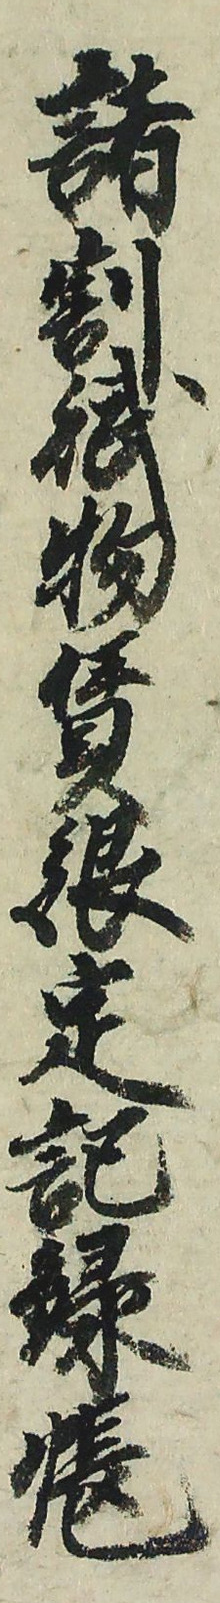諸割賦物賃銀定記録帳
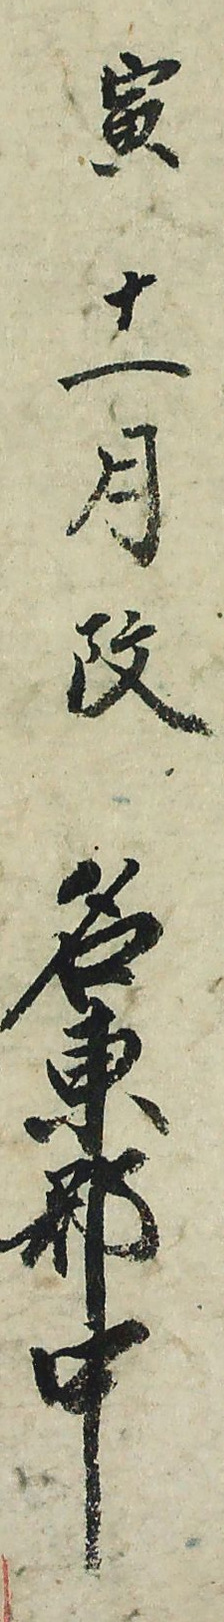寅十一月改名東郡中

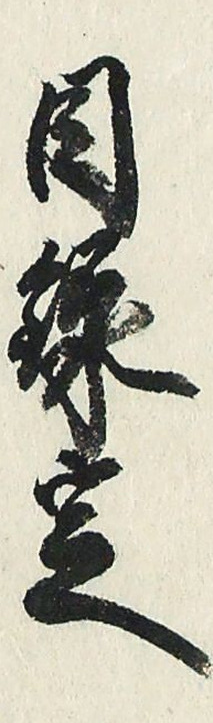目録定
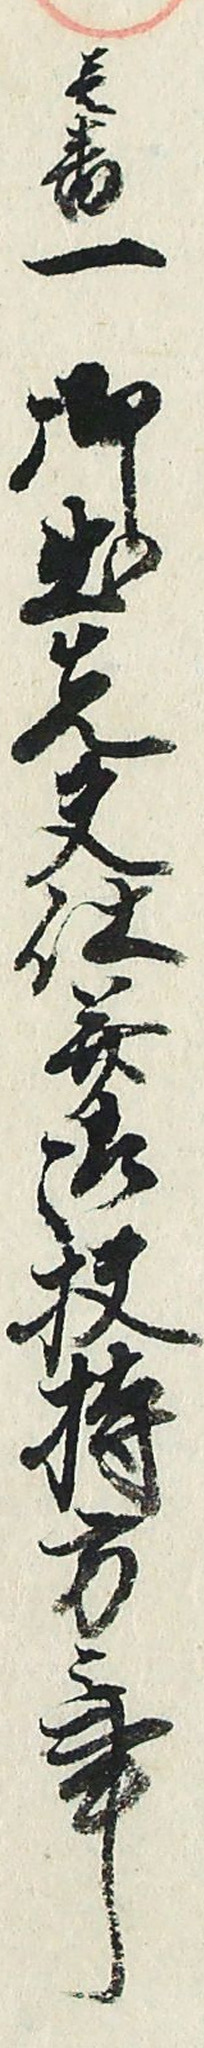一番一御出先夫仕幷御扶持方之事
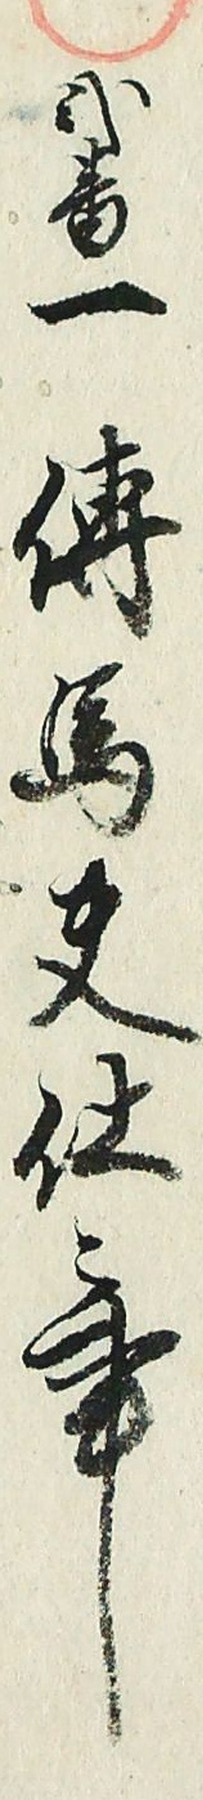二番一伝馬夫仕之事
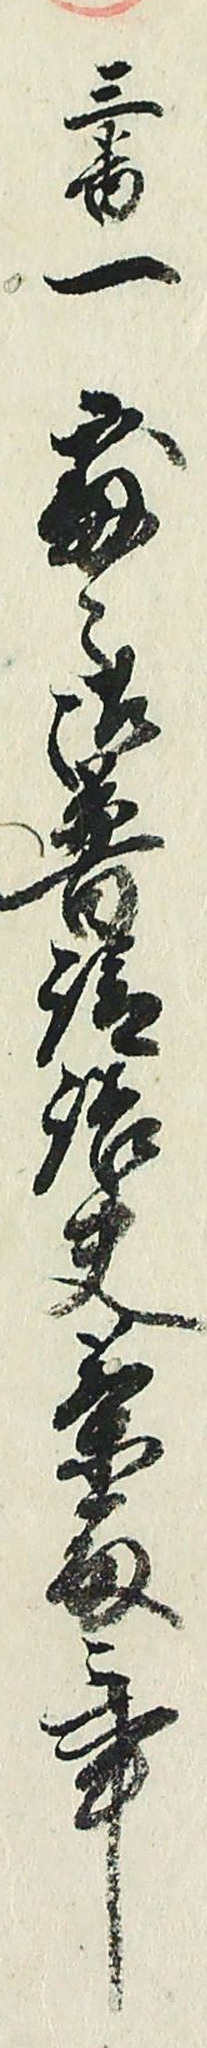三番一処々御普請詰夫茶番之事
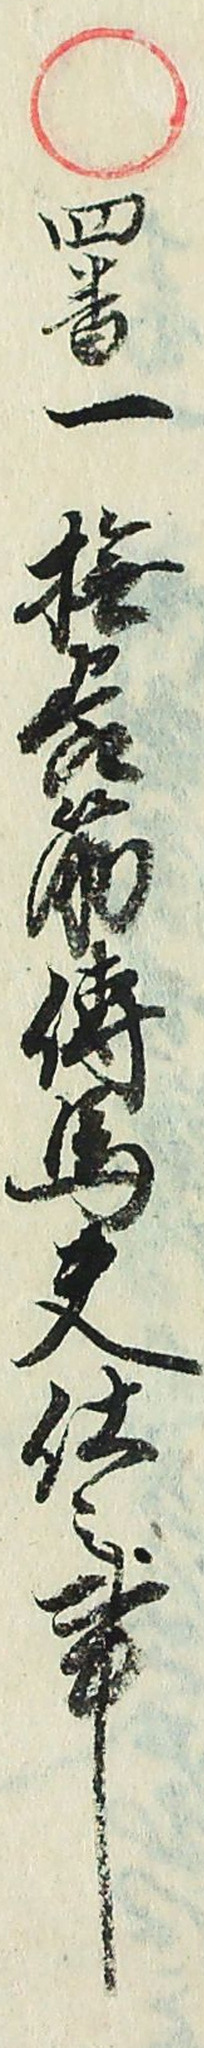四番一撫養筋伝馬夫仕之事
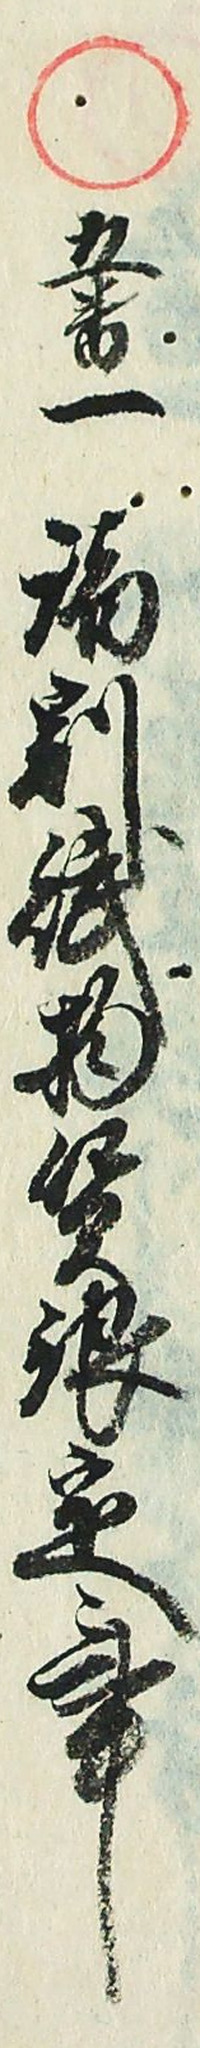五番一諸割賦物賃銀定之事
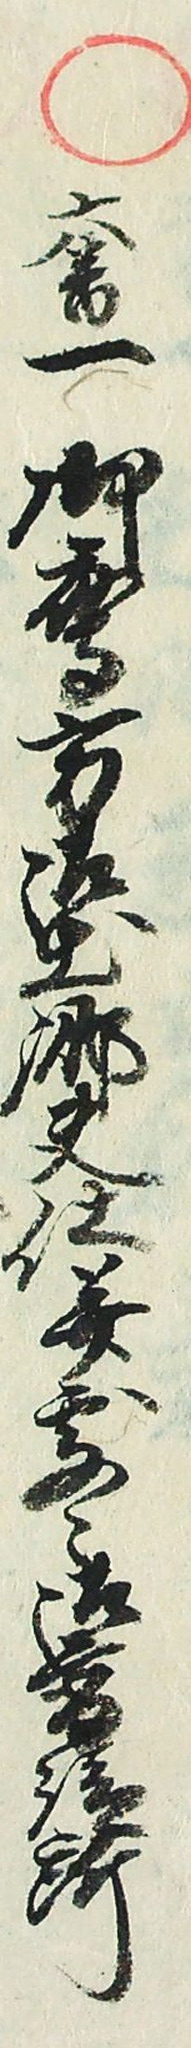六番一御鷹方御出郷夫仕幷処々御普請所
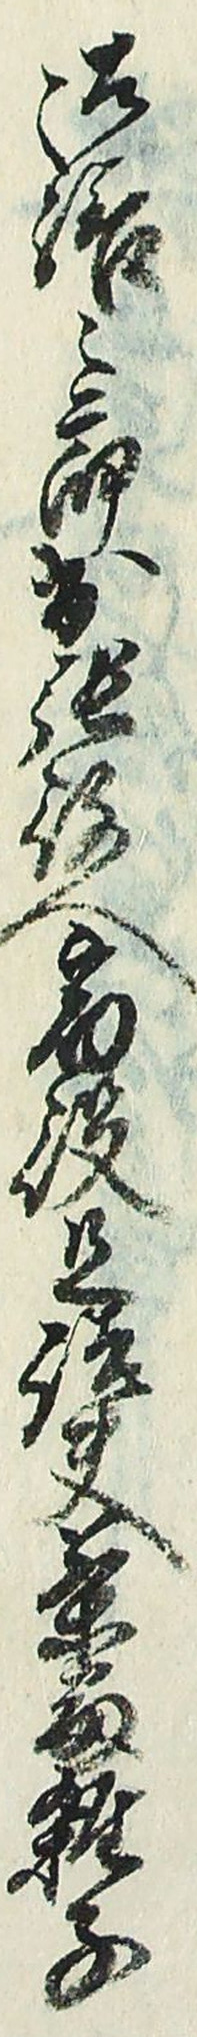御繕之節出張役人宿役且詰夫茶番雑子
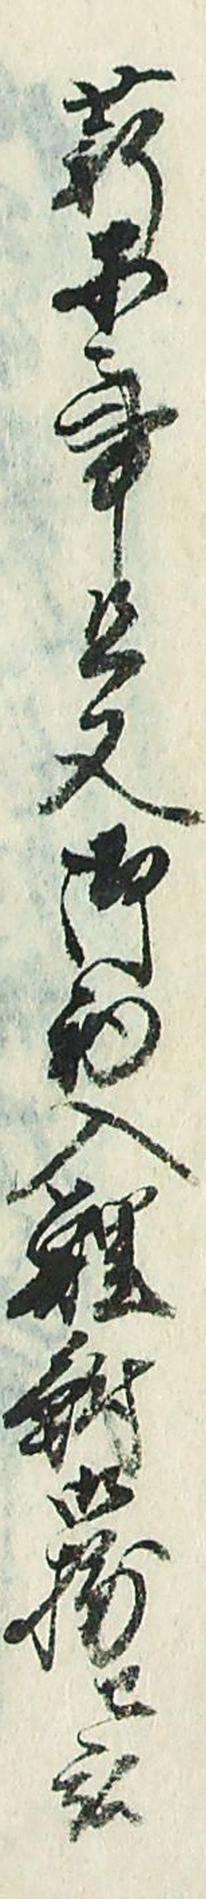薪木之事且又御初入鯉鮒御捌せ被

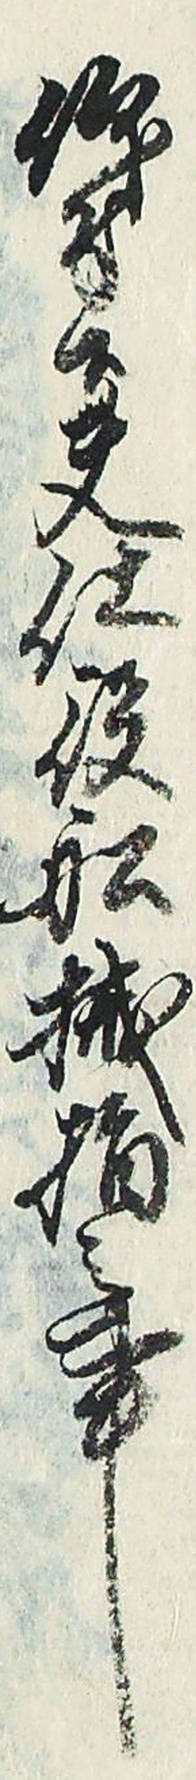仰付候夫仕役船械指之事
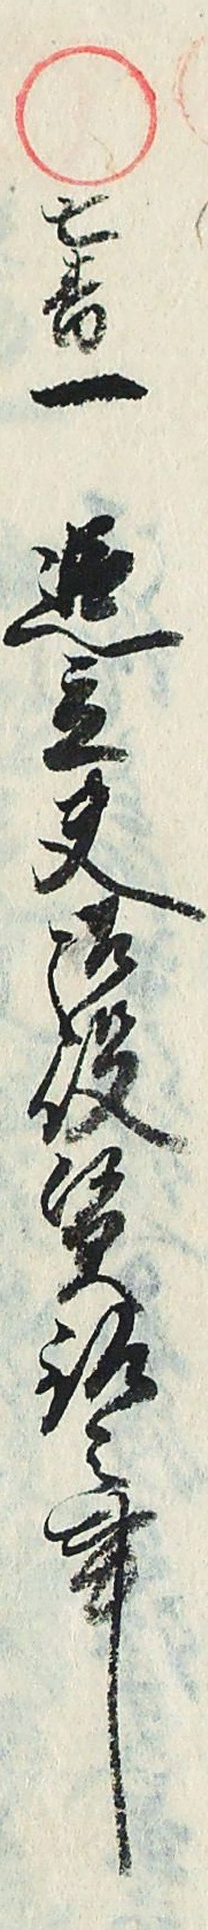七番一進立夫御役賃銀之事
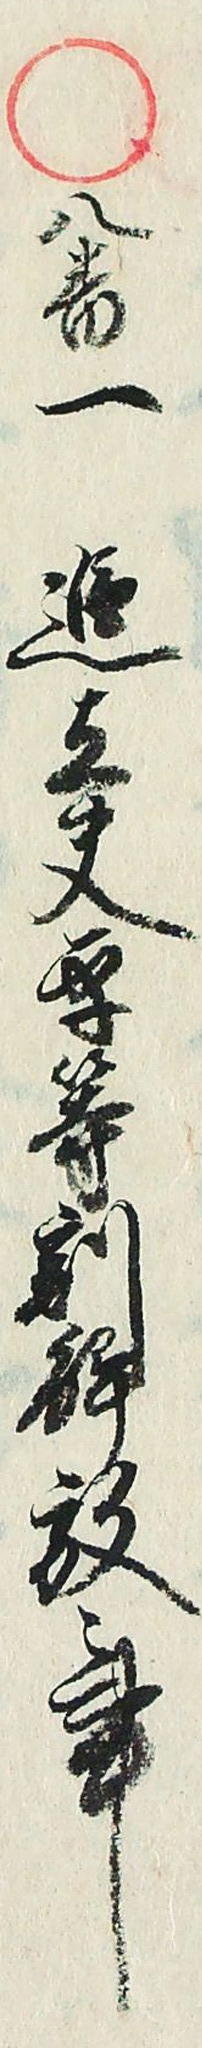八番一進立夫平等割解放之事
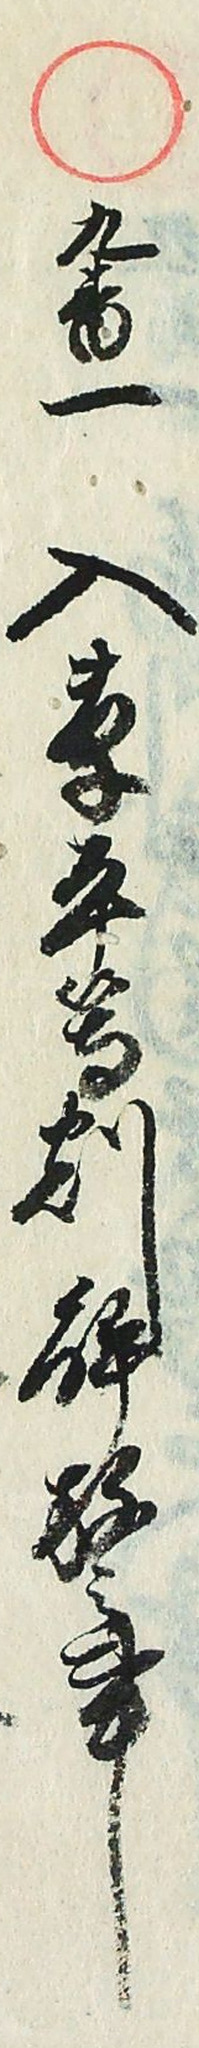九番一入草平等割解放之事
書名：諸割賦物賃銀定記録帳
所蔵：鳴門教育大学 Naruto University of Education
